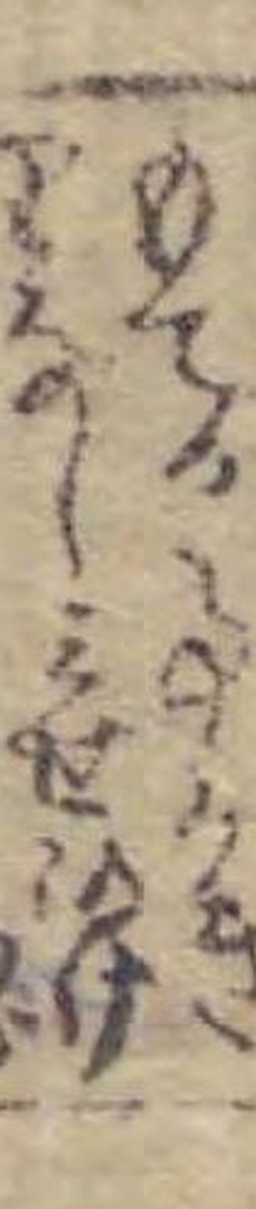りなしみせひけ
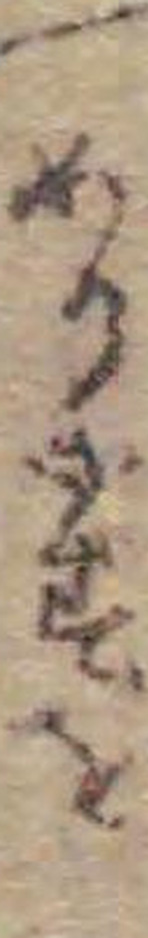めりやすを
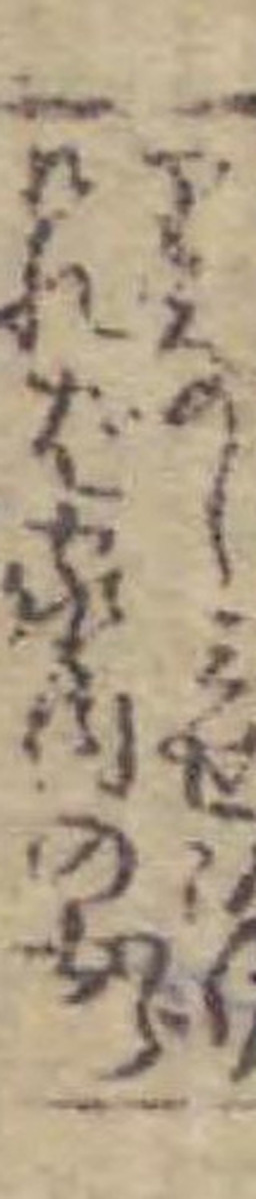ければ家内の女郎
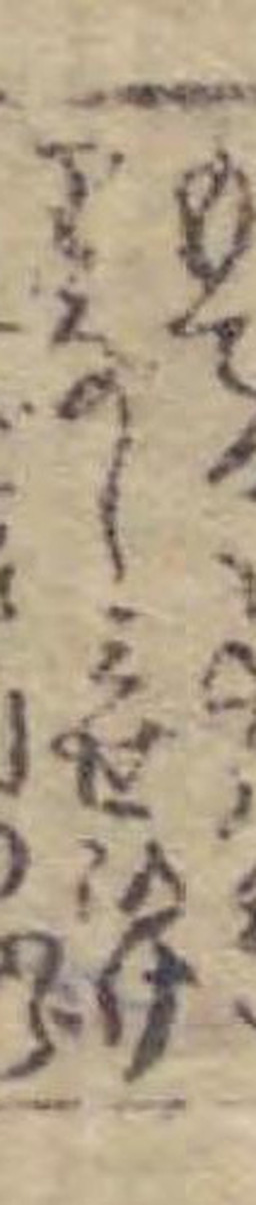りなしみせひけ
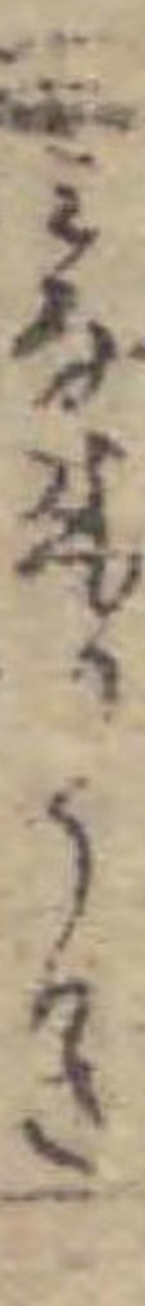みな来りうるさ
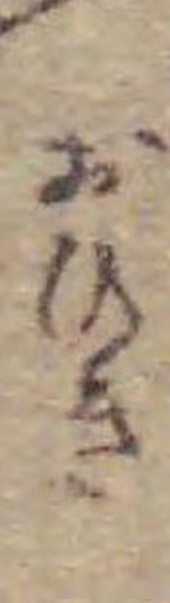おひき
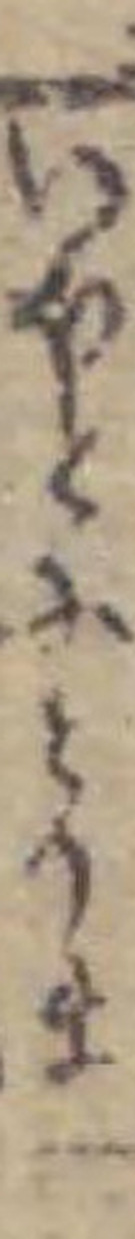いほとにとりま
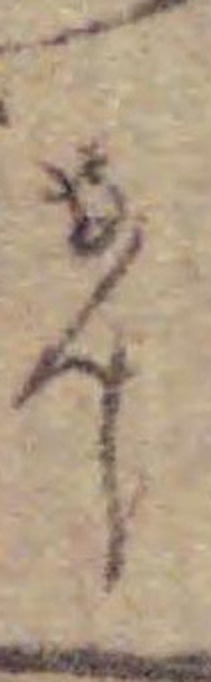なんし
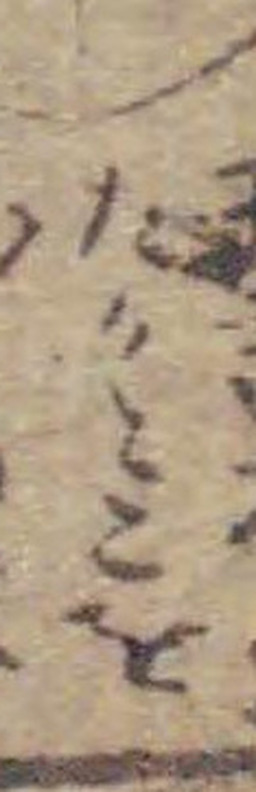たかとこを
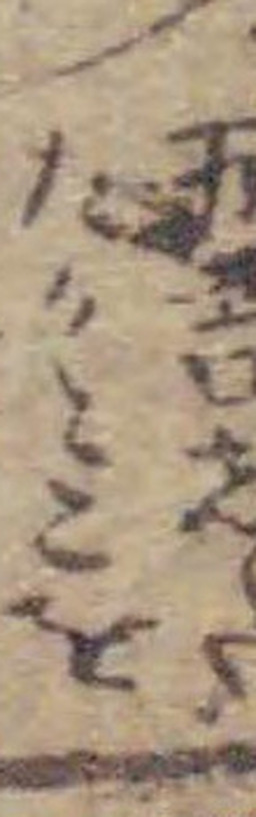たかとこを
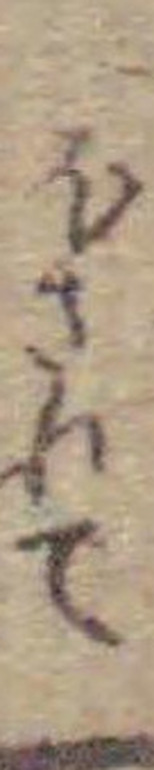ほされて
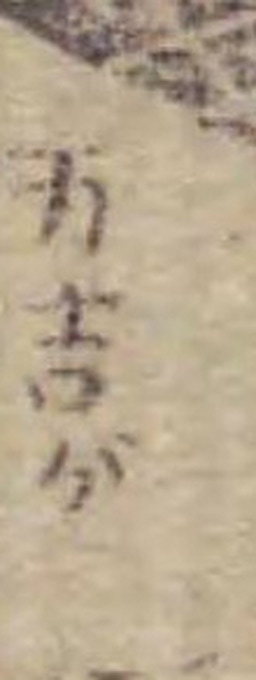万吉が
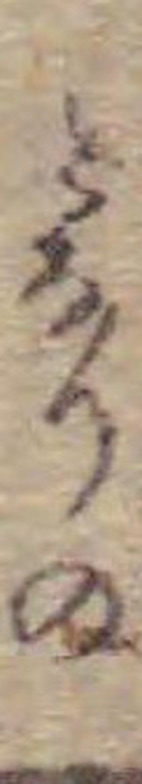となりの
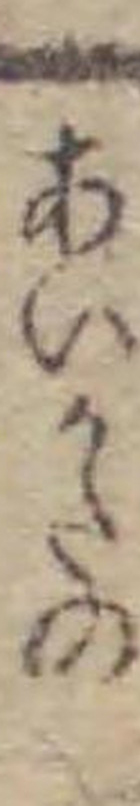あいかたの
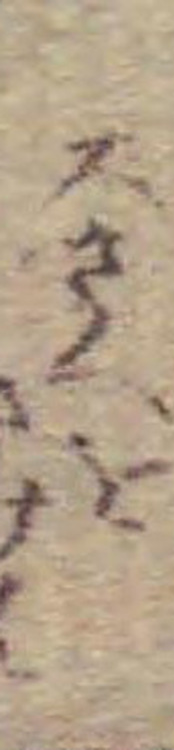大さへを
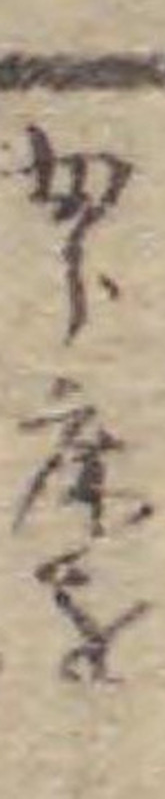女郎床を
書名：鼻峰高慢男 : 2巻
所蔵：国立国会図書館 National Diet Library, JAPAN
